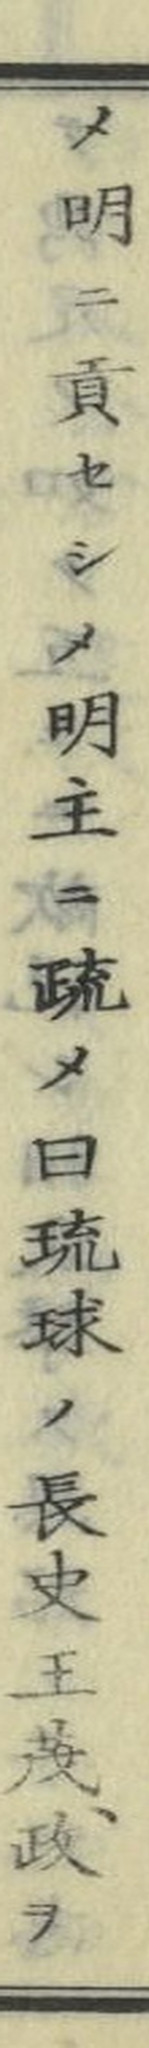シテ明ニ貢セシメ明主ニ琉シテ曰琉球ノ長史王茂、政ヲ
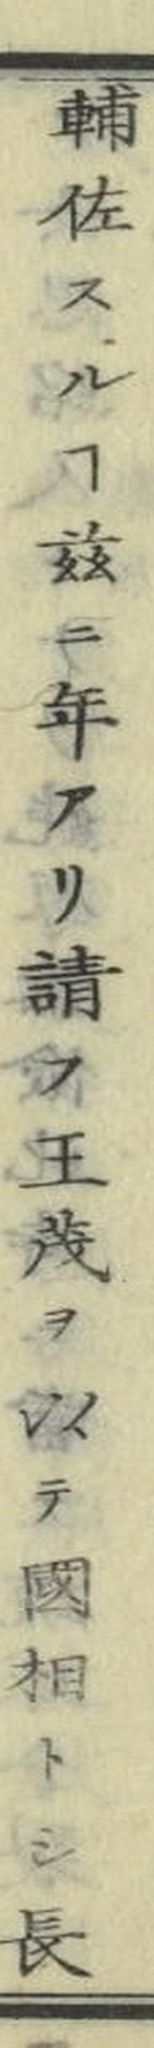輔佐スルコト茲ニ年アリ請フ王茂ヲ以テ國相トシ長
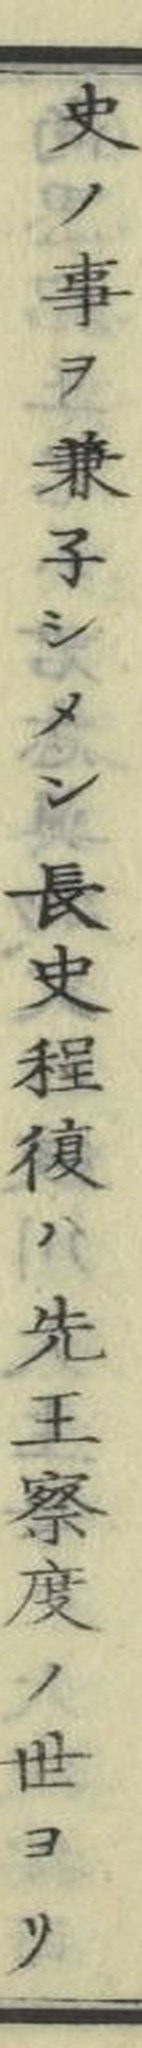史ノ事ヲ兼子シメン長史程復ハ先王察度ノ世ヨリ
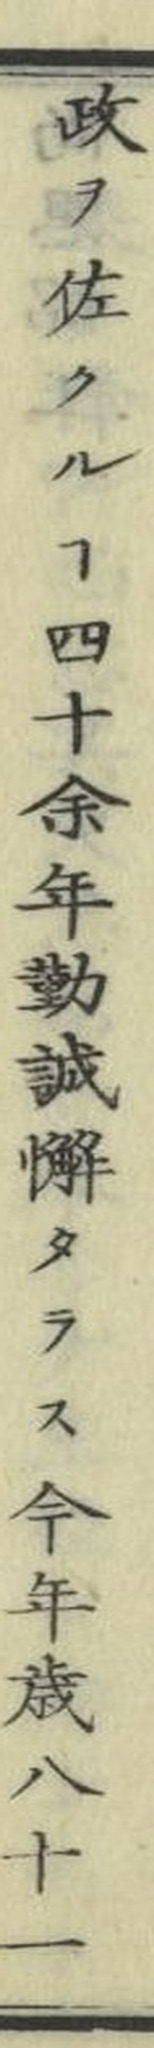政ヲ佐クルコト四十余年勤誠懈タラス今年歳八十一
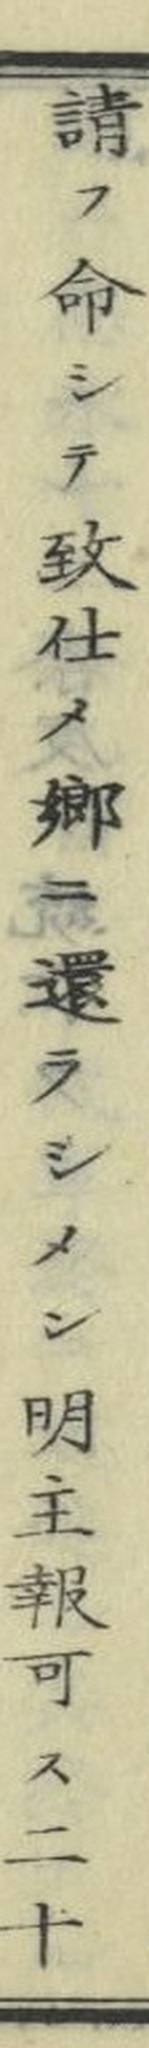請フ命シテ致仕シメ郷ニ還ラシメン閃主報可ス二十
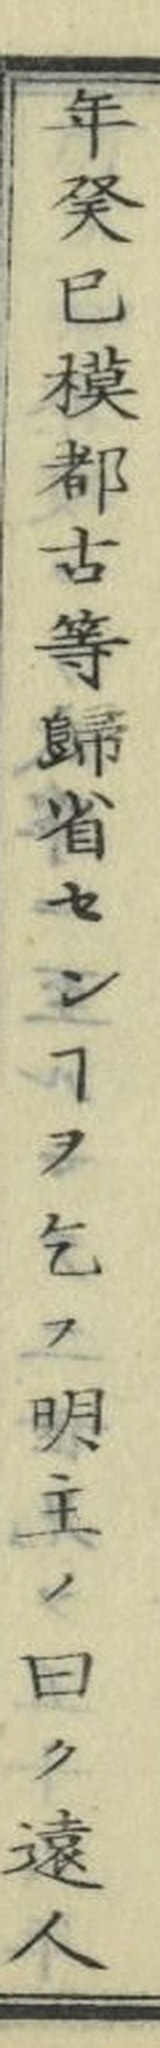年癸己模都古等歸省センコトヲ乞フ明主ノ曰ク遠人
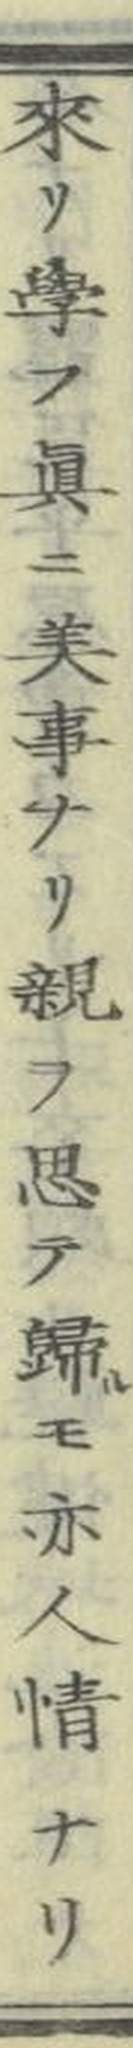來リ學フ眞ニ美事ナリ親ヲ思テ歸モ亦人情ナリ
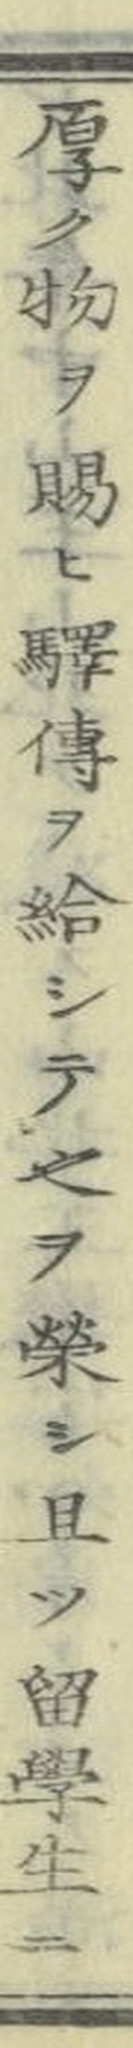厚ク物ヲ賜ヒ驛傳ヲ給シテ之ヲ榮シ且ツ留學生ニ
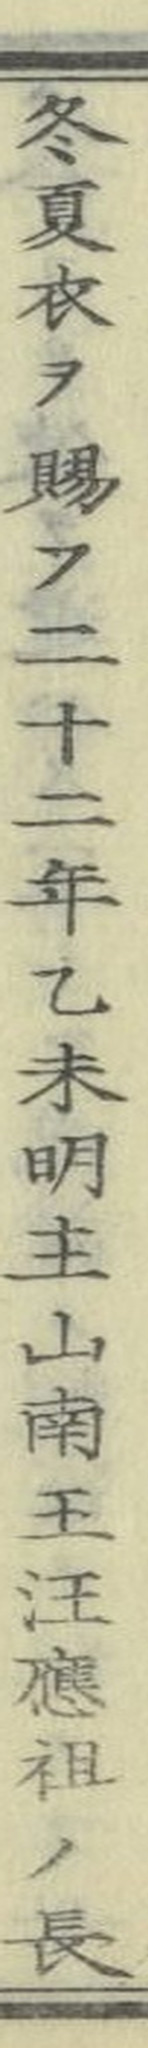冬夏衣ヲ賜フ二十二年乙未明主山南王汪應祖ノ長
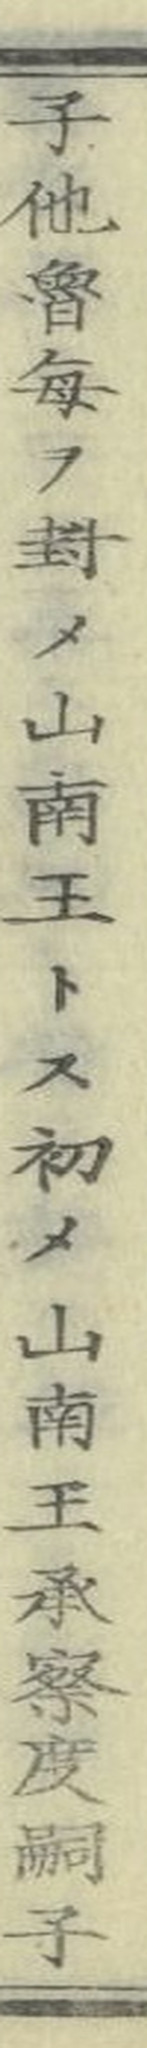子他魯每ヲ封シテ山南王トス初メ山南王承察度嗣子
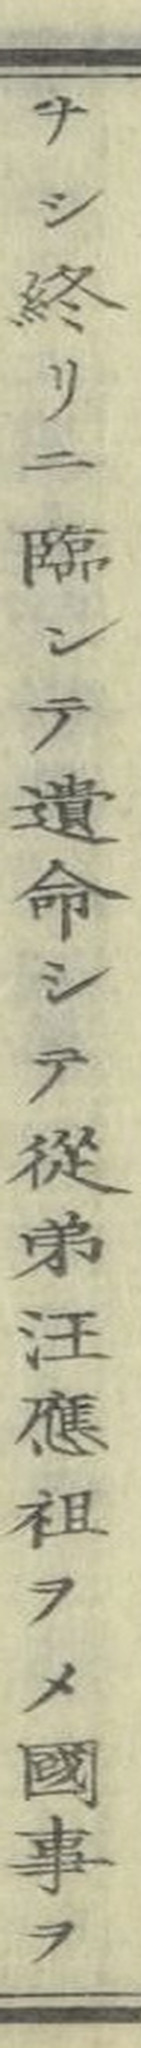ナシ終リニ臨ンテ遺命シテ從弟汪應租ヲシテ國事ヲ
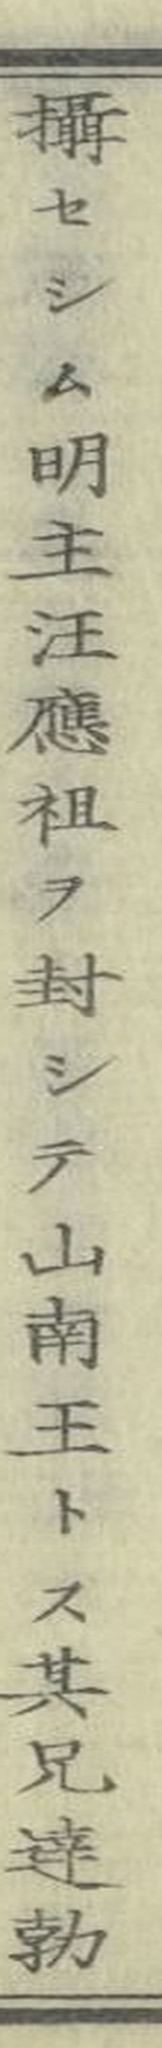攝セシム明主汪應祖ヲ封シテ山南王トス其兄達勃
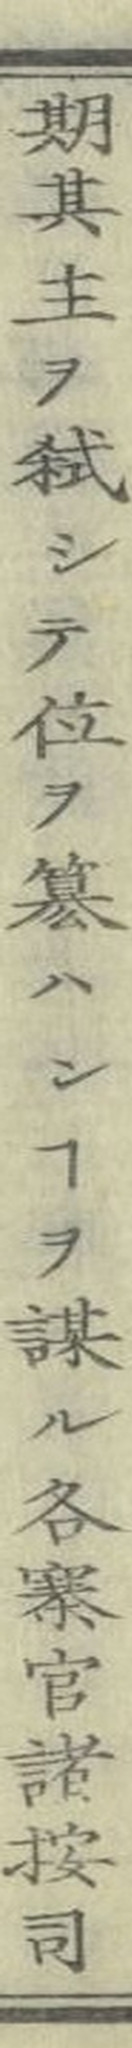期其主ヲ弑シテ位ヲ簒ハンコトヲ謀ル各寨諸按司
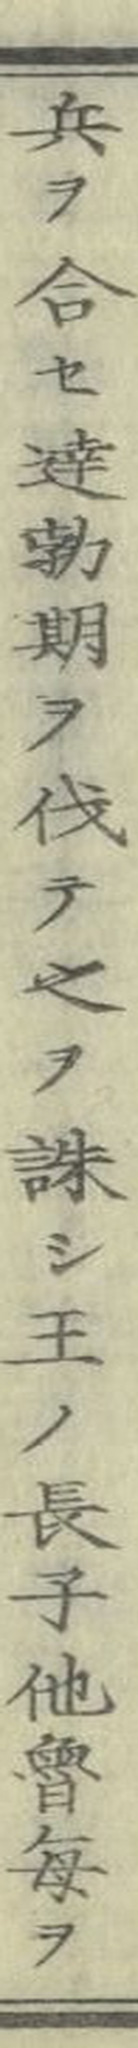兵ヲ合セ達勃期ヲ伐テ之ヲ誅シ王ノ長子他魯毎ヲ
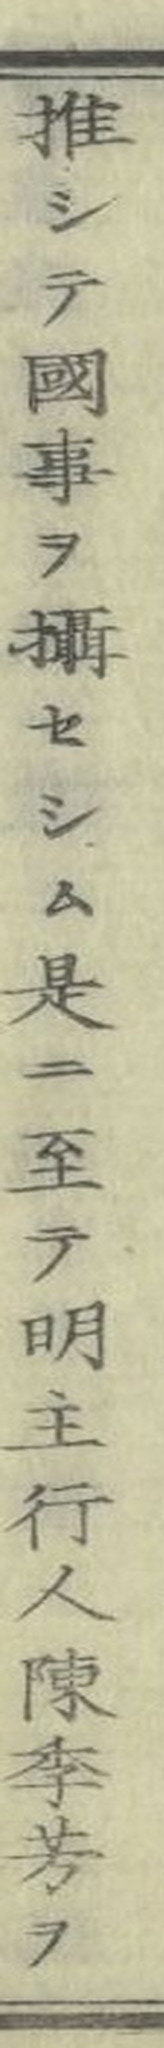推シテ國事ヲ攝セシム是ニ至テ明主行人陳季芳ヲ
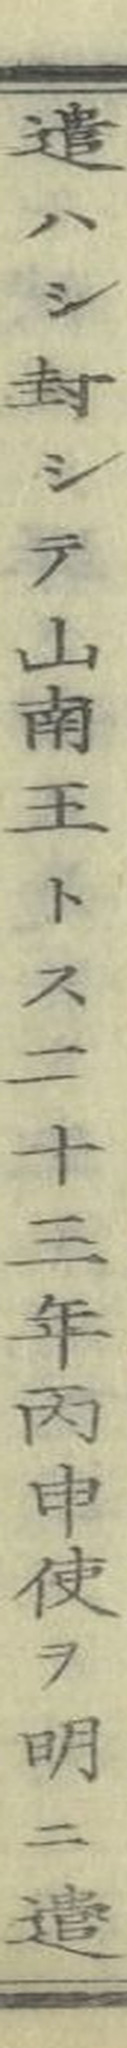遣ハシ封シテ山南王トス二十三年丙申使ヲ明ニ遣
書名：琉球藩史 一之巻
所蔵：University of the Ryukyus Library
